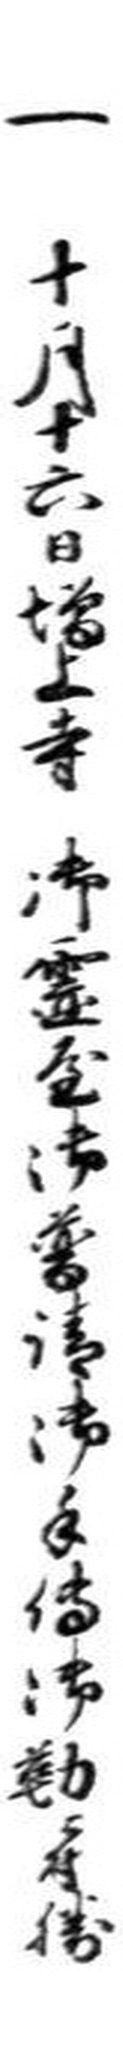一十月十六日増上寺御霊屋御普請御手伝御勤ニ付勝
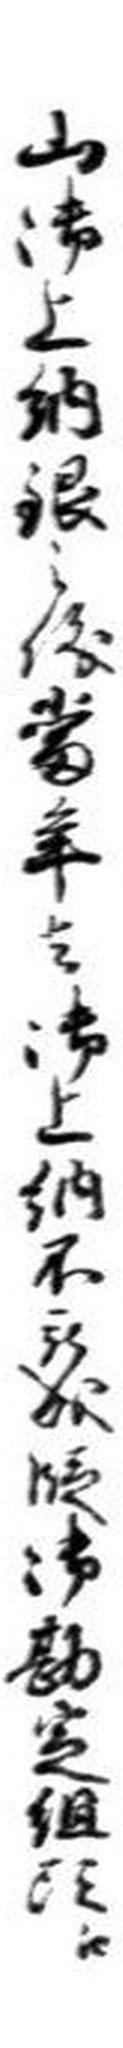山御上納銀之儀当年者御上納不被成段御勘定組頭江
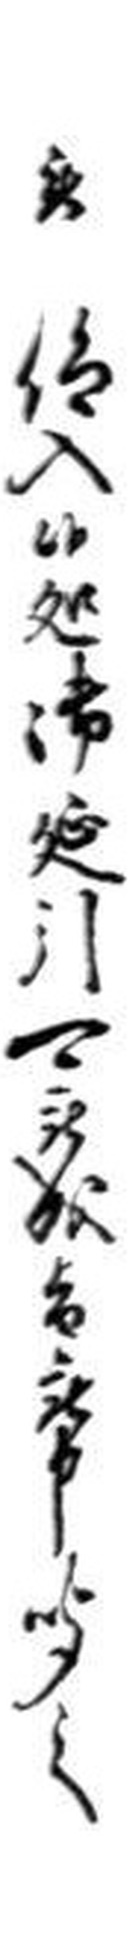被仰入候処御延引可被成旨被申聞之
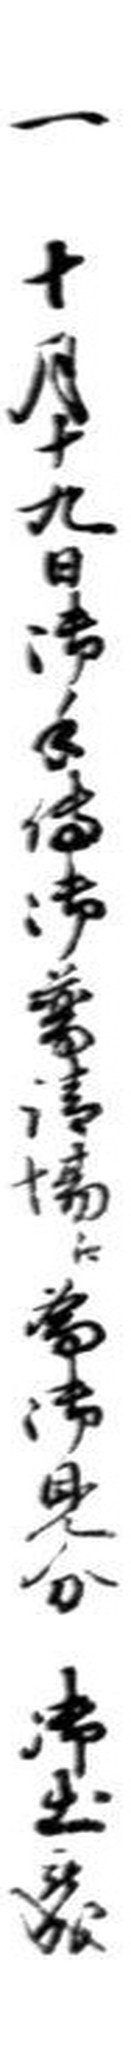一十月十九日御手伝御普請場江為御見分御出被成
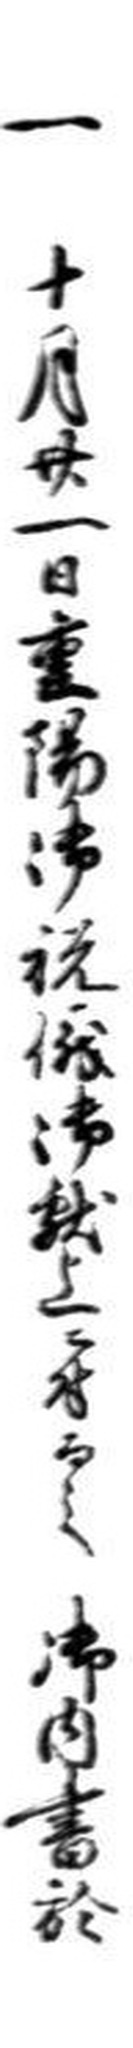一十月廿一日重陽御祝儀御献上ニ付而之御内書於
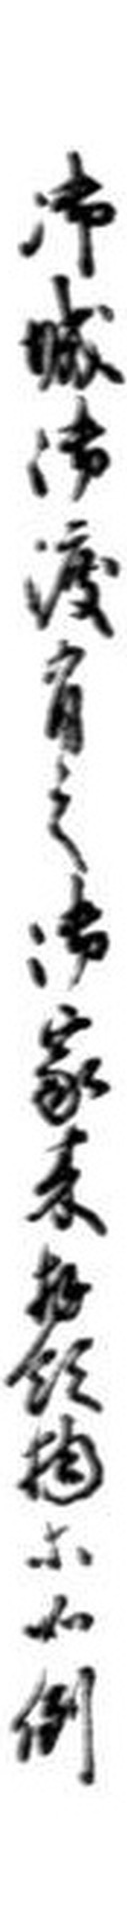御城御渡有之御家来拝領物等如例
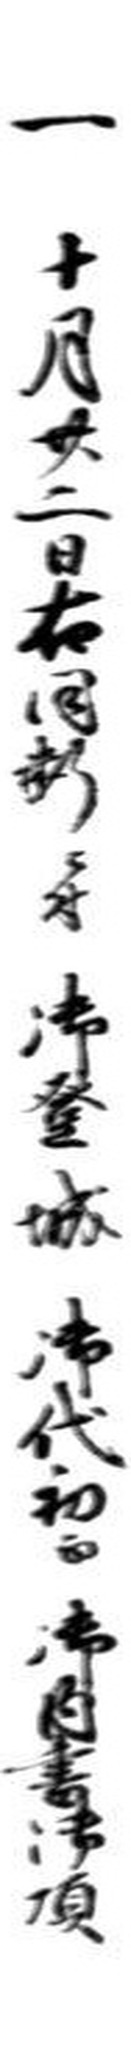一十月廿二日右同断ニ付御登城御代初而御内書御頂
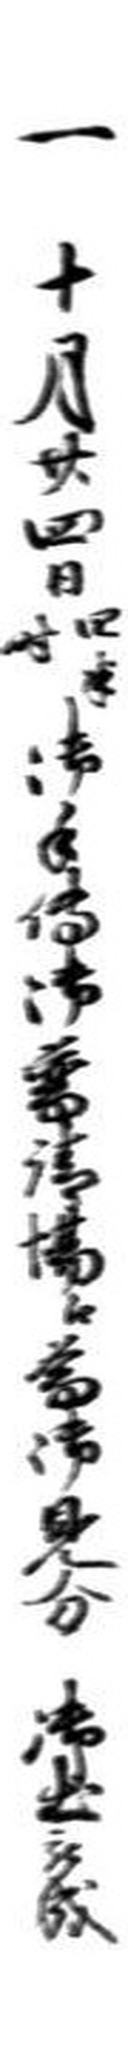一十月廿四日四半時御手伝御普請場江為御見分御出被成
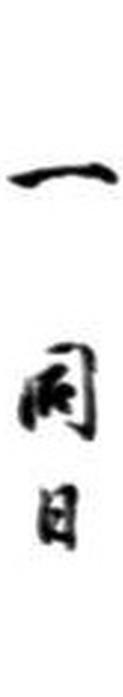一同日
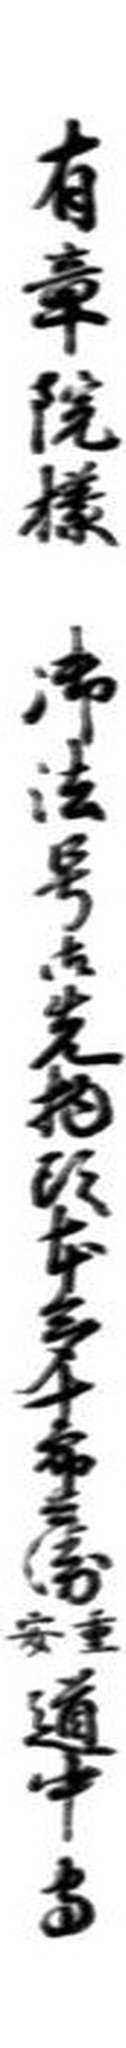有章院様御法号御先物頭本多十郎兵衛重安道中守
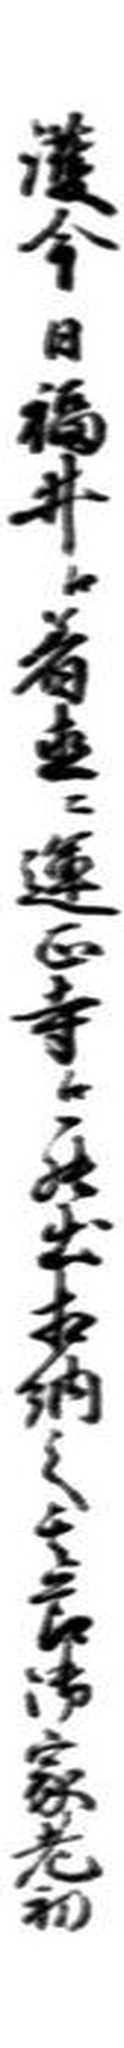護今日福井江着直ニ運正寺江罷出相納之其節御家老初
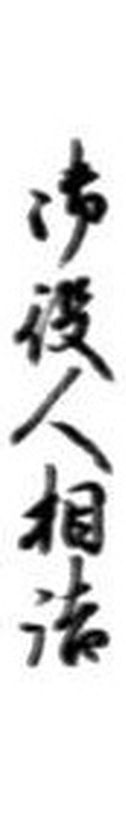御役人相詰
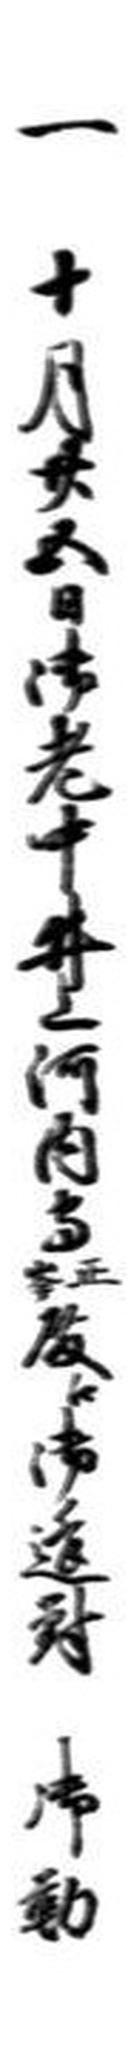一十月廿五日御老中井上河内守正岑殿江御逢対御勤

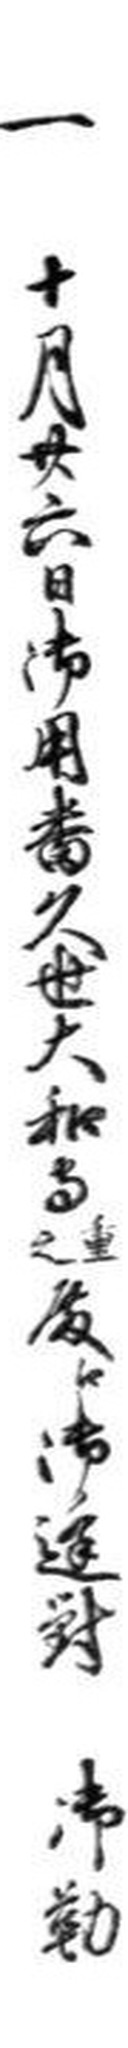一十月廿六日御用番久世大和守重之殿江御逢対御勤
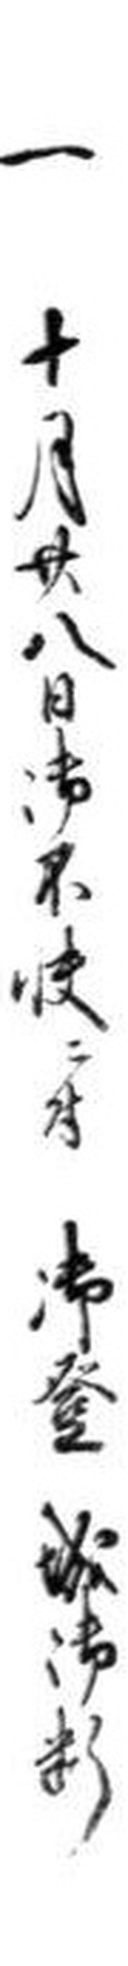一十月廿八日御不快ニ付御登城御断
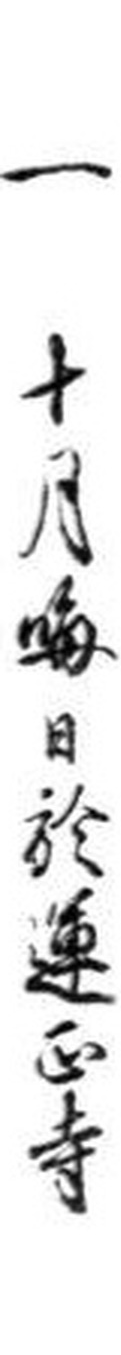一十月晦日於運正寺
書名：家譜 三十一 吉邦公 享保元年
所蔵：福井県文書館 Fukui Prefectural Archives
